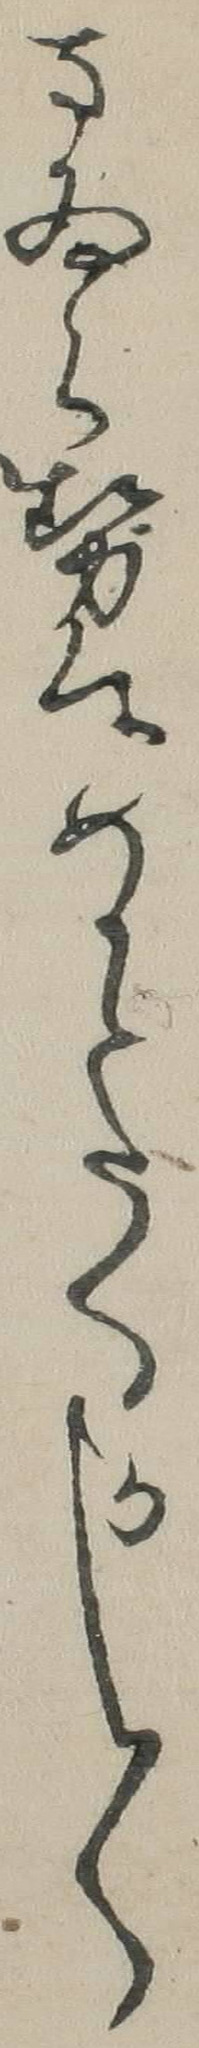まゐらせ候めてたくかしく
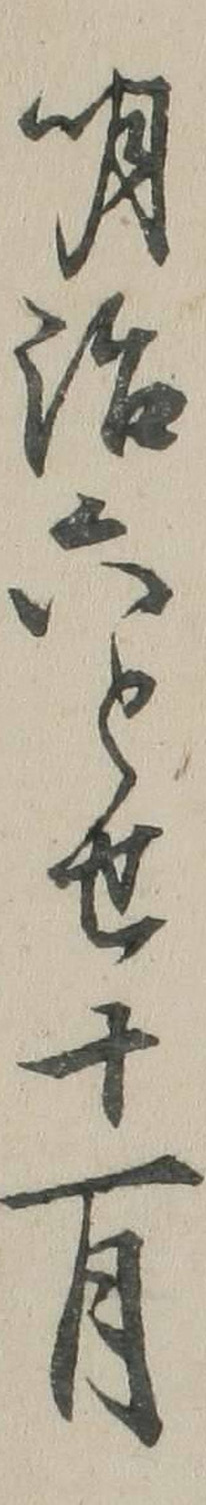明治六とせ十一月
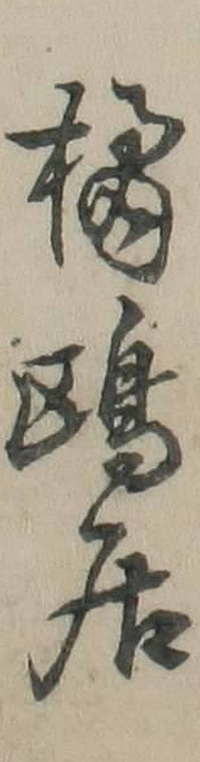橘鴎居
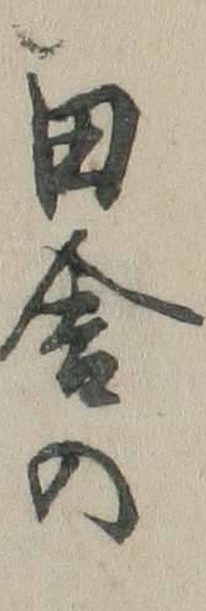田舎の
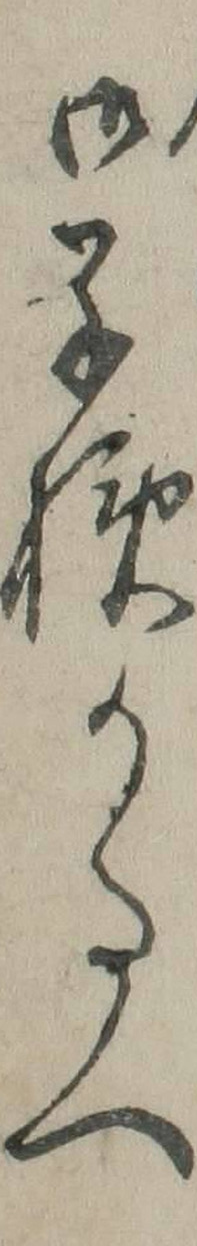御子様かたへ

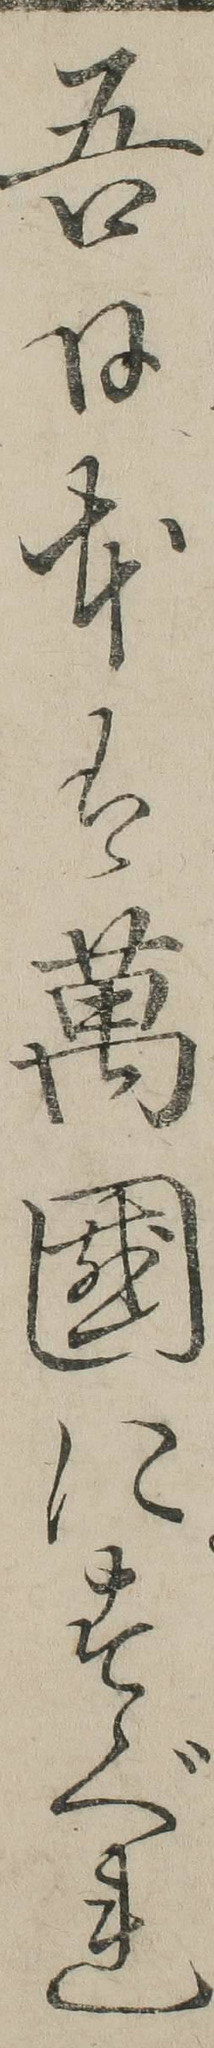吾日本は。万国に。すぐれ
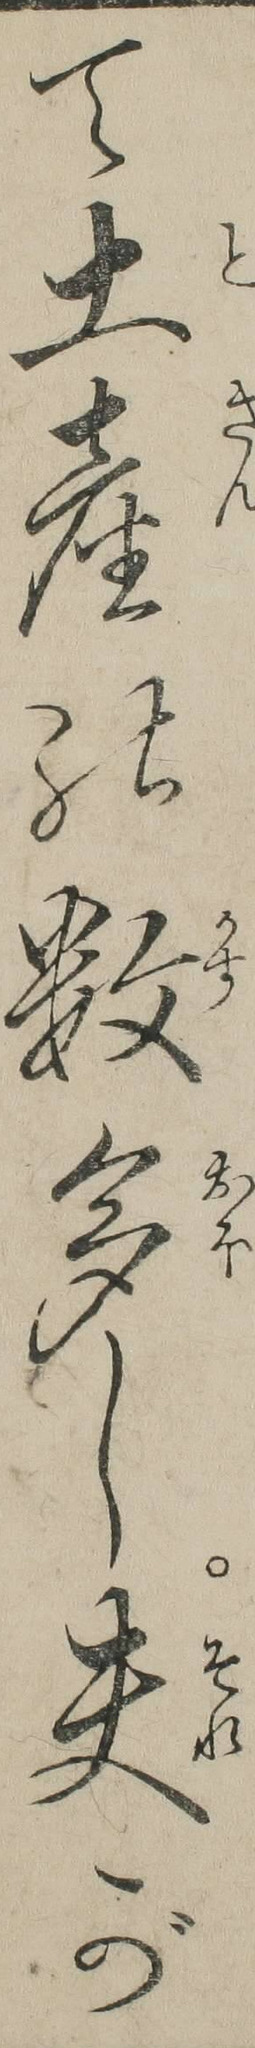て土産の数多し。夫が
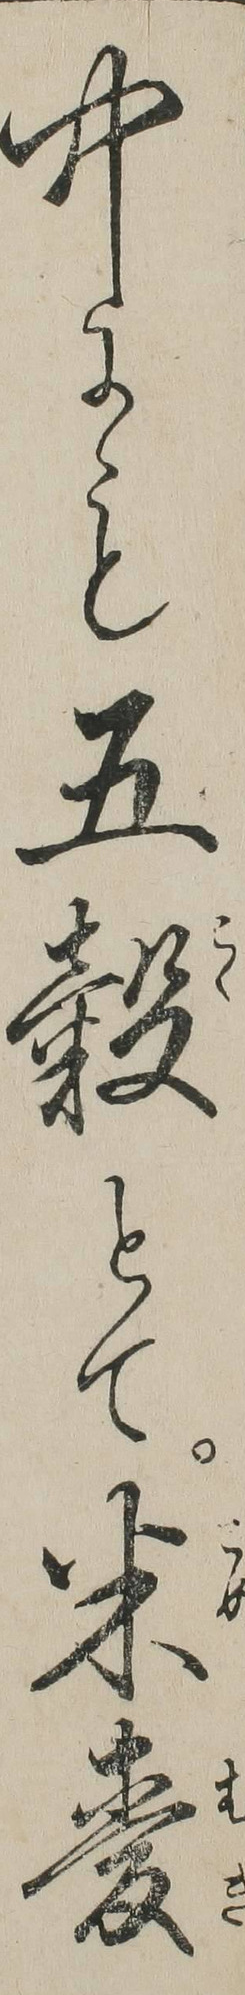中にも五穀とて。米麦
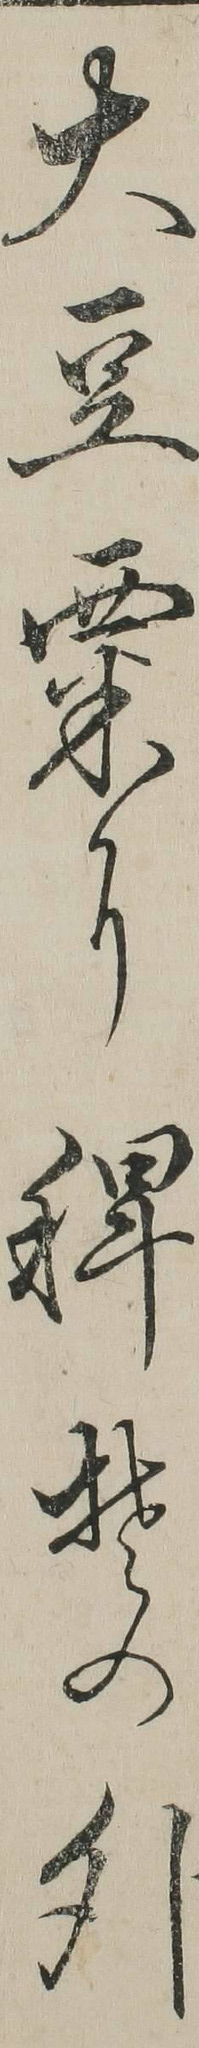大豆粟に稗。その外
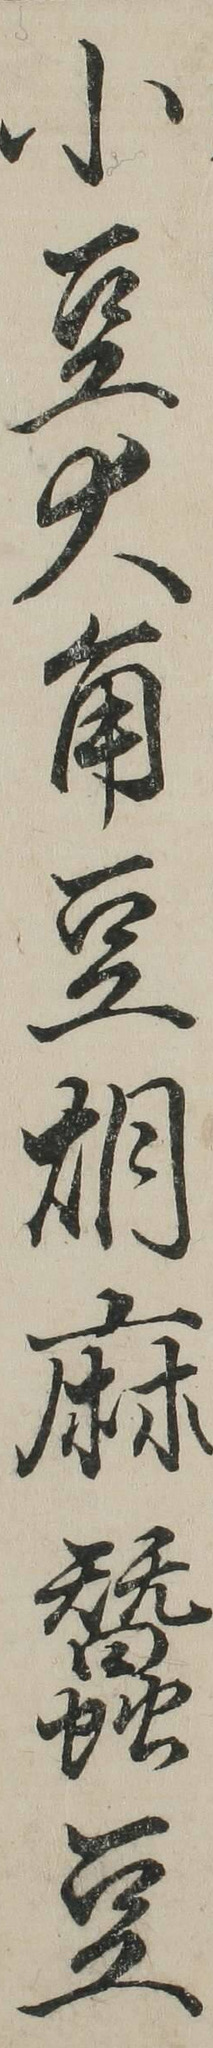小豆大角豆胡麻。蚕豆
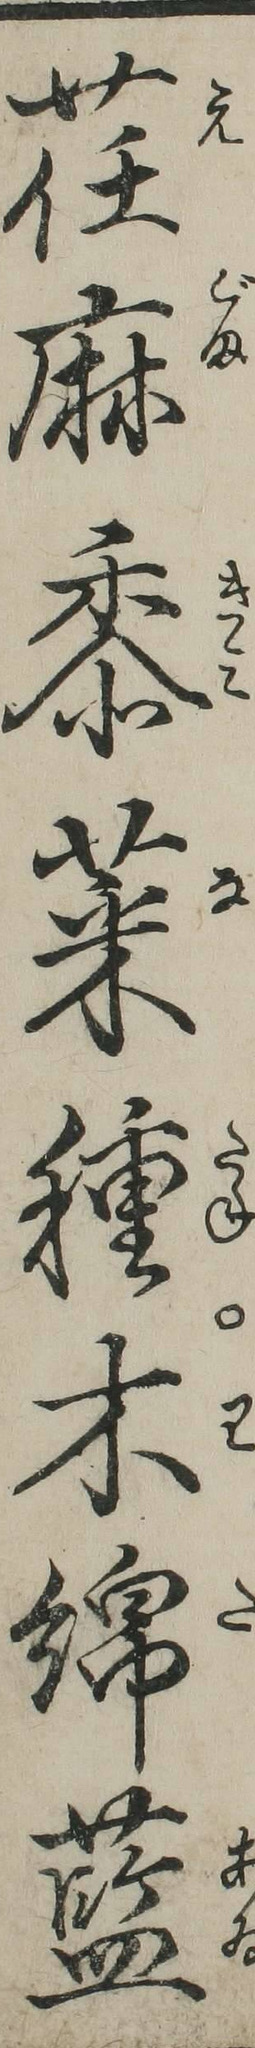荏麻黍菜種。木綿藍

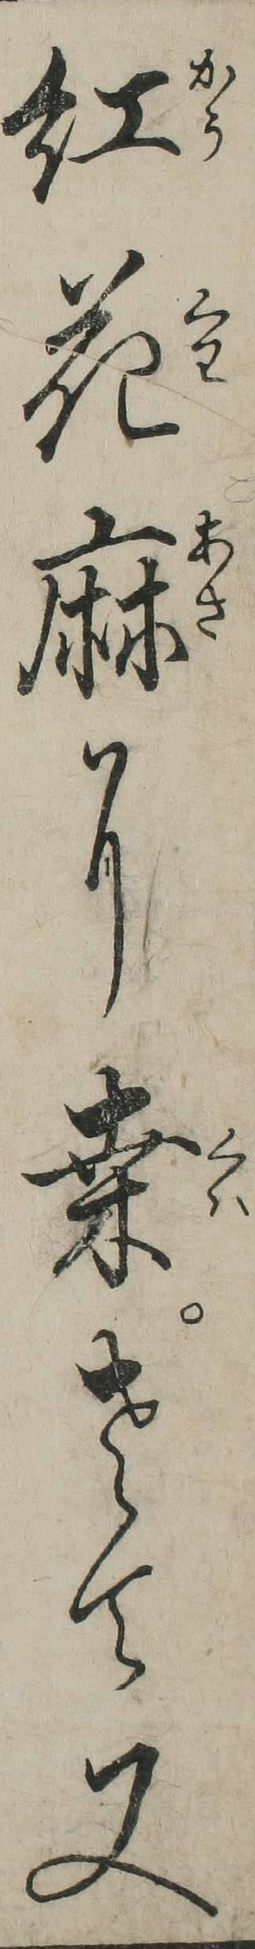紅花麻に桑。さて又
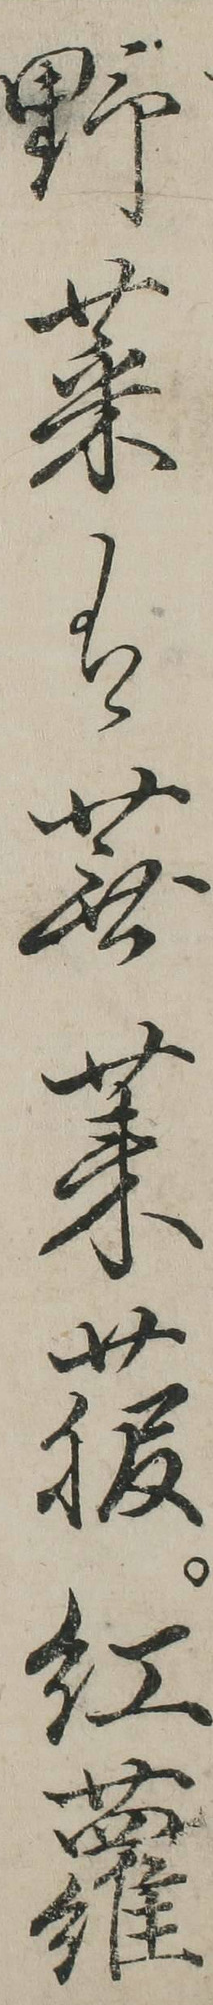野菜は蕪萊菔。紅蘿
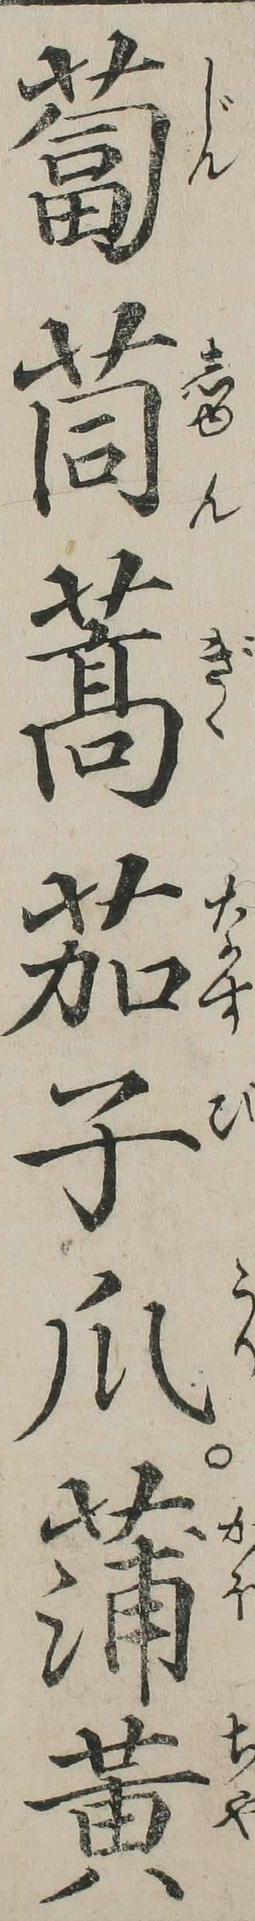蔔茼蒿茄子瓜。蒲黄
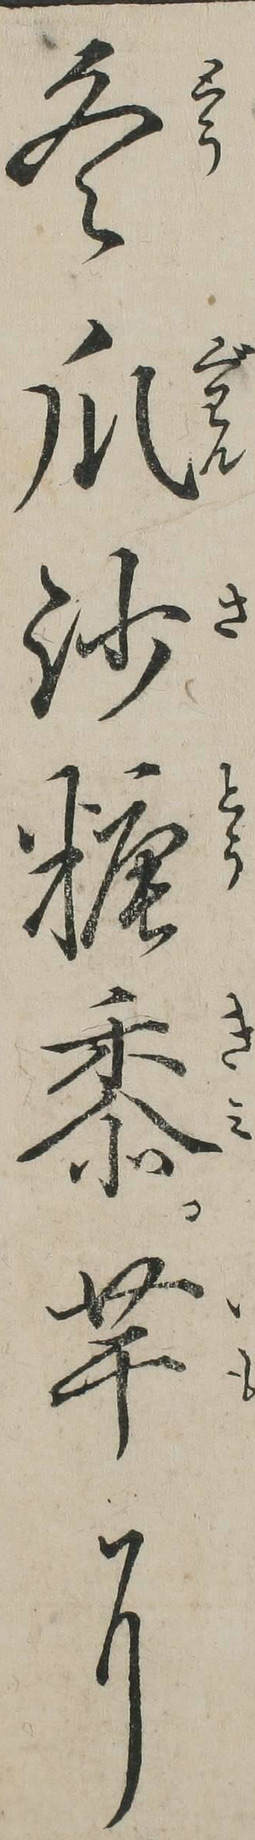冬瓜沙糖黍。芋に
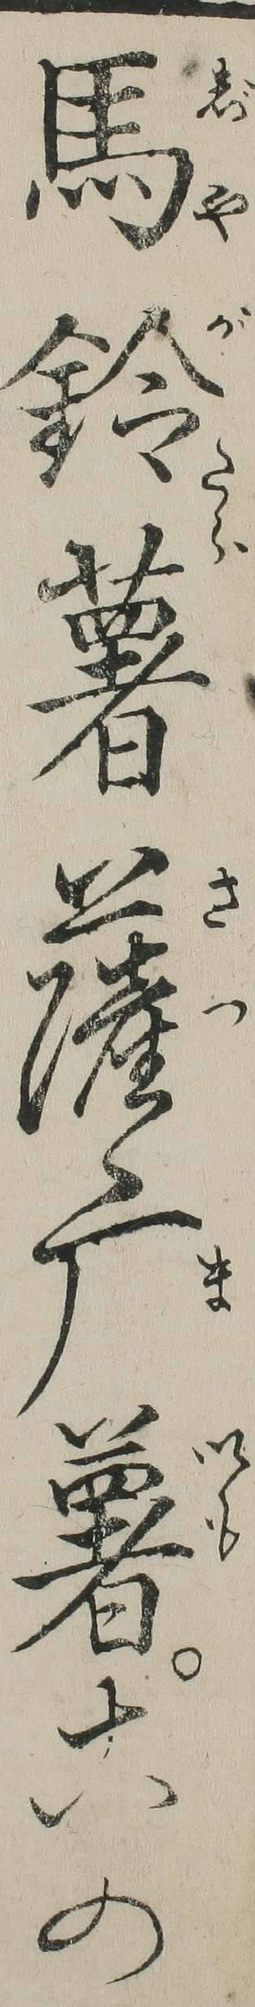馬鈴薯薩摩薯。この
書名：農蠶必要日読往来
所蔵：東京学芸大学附属図書館 国文学研究資料館
